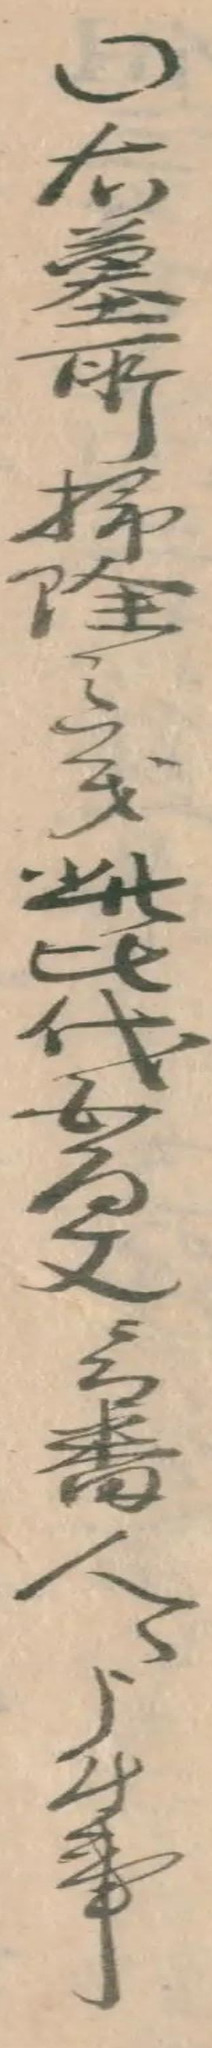○右墓所掃除之義此比代五百文ニ而番人へ申付事
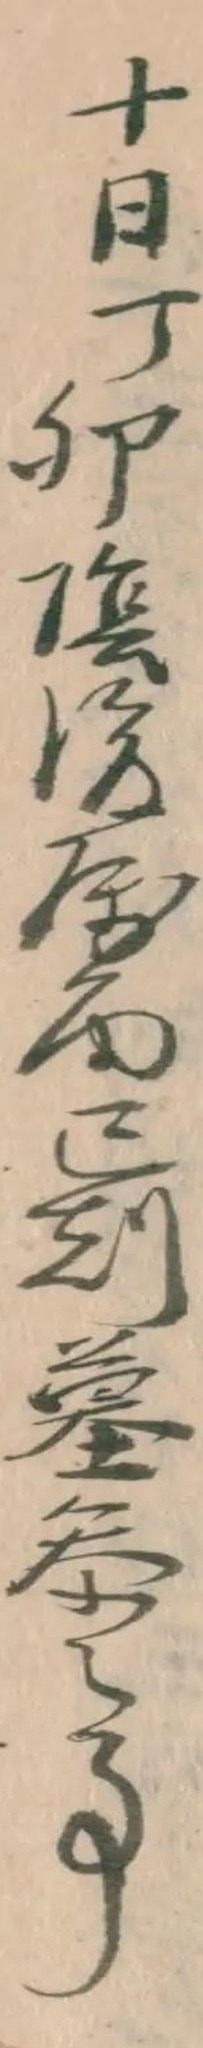十日丁卯陰後雨巳刻墓参之事
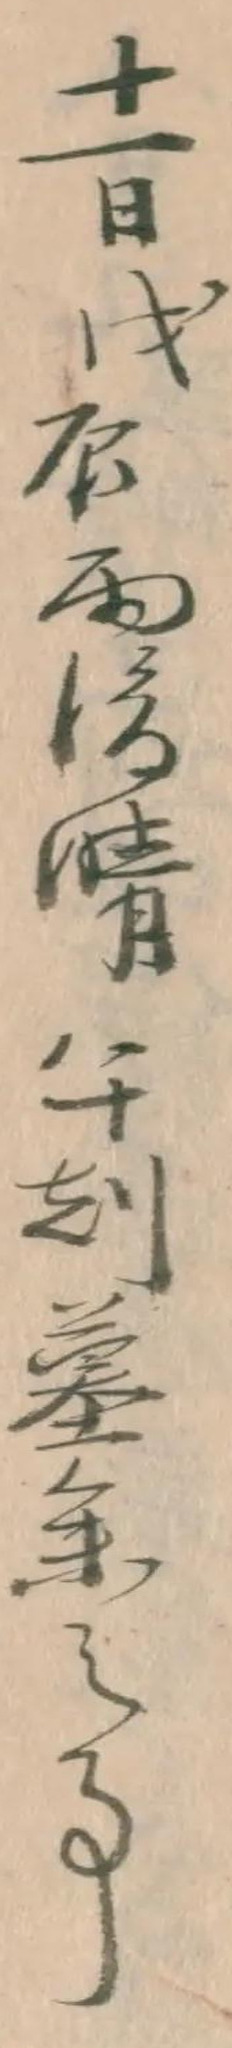十一日戊辰雨後晴午刻墓参之事
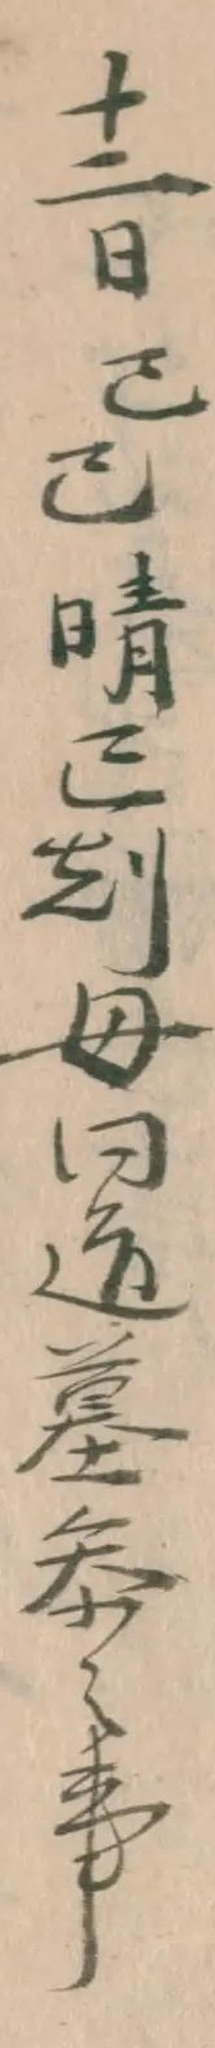十二日己巳晴巳刻母同道墓参之事
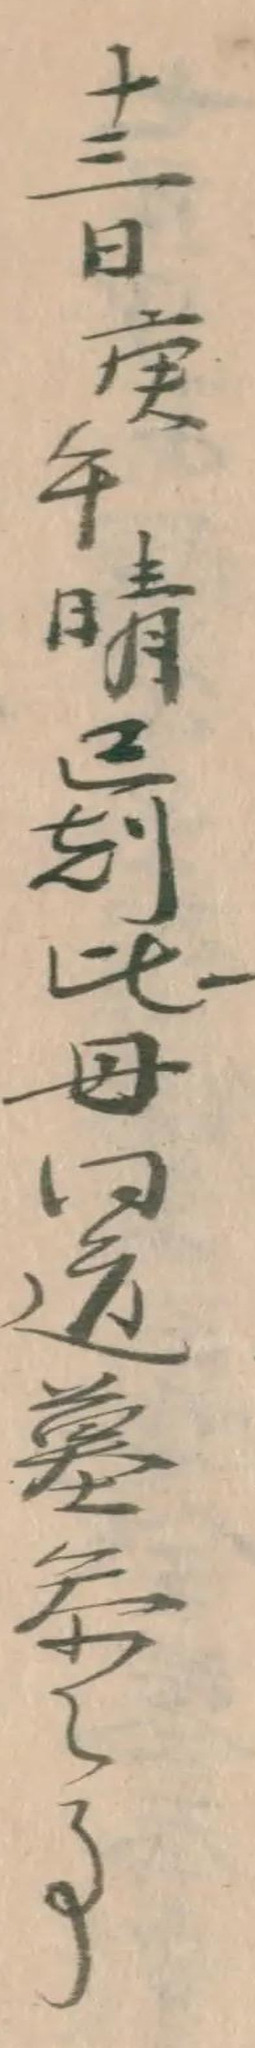十三日庚午晴巳刻頃母同道墓参之事
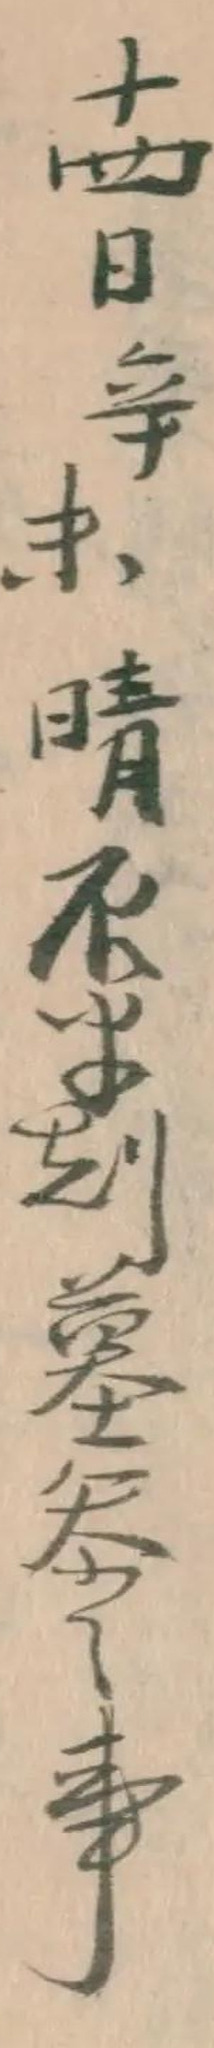十四日辛未晴辰半刻墓参之事
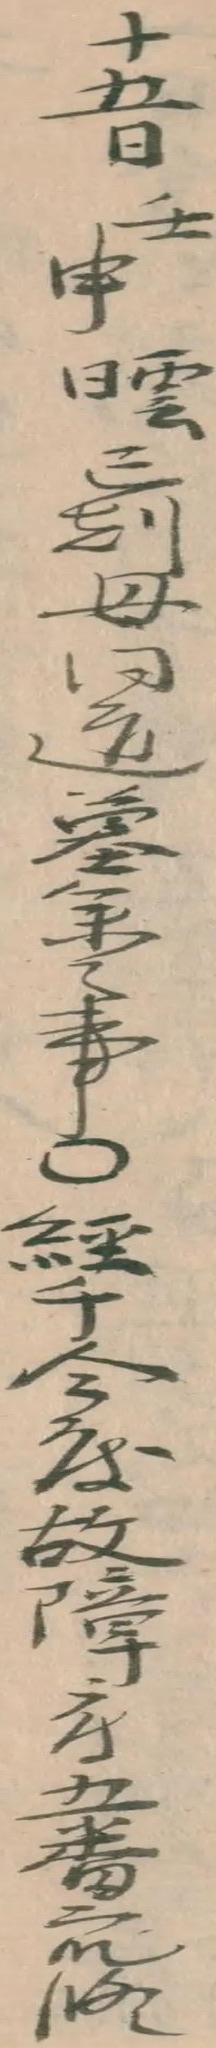十五日壬申曇巳刻母同道墓余之事○経千今度故障ニ付五番衆修
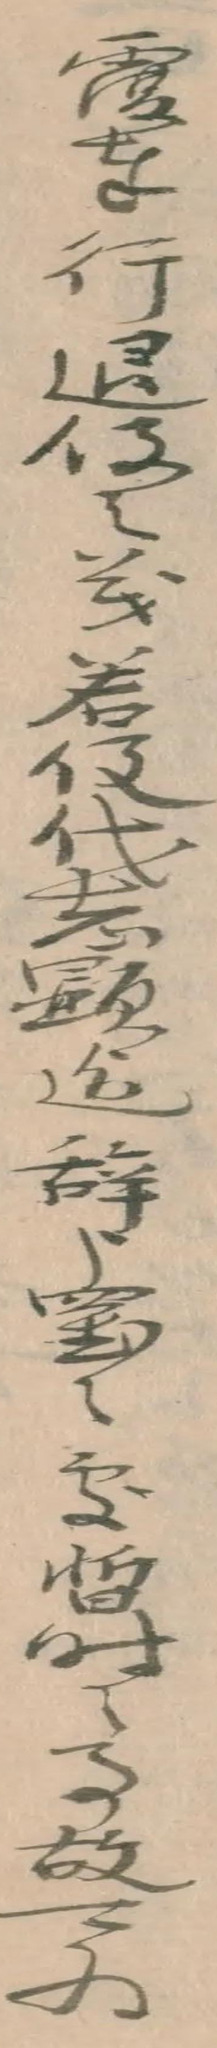覆奉行退役之義若役代志顕迄辞申置候處暫時之事故可為
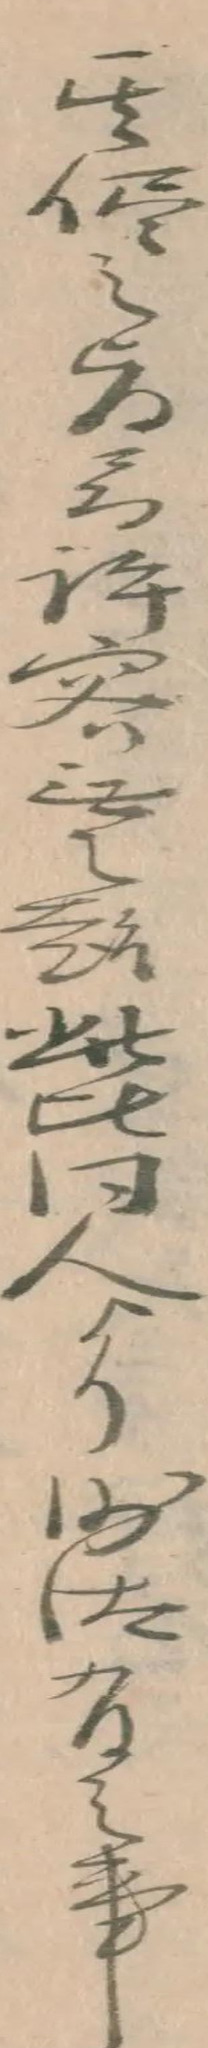其儘之旨ニ而許容無之趣此比同人より沙汰有之事
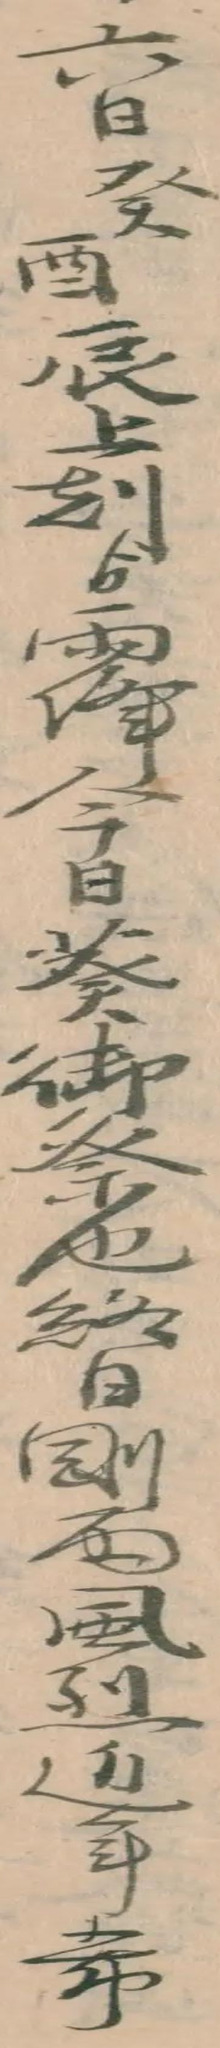十六日乙亥酉辰上刻ゟ雨降今日葵御祭也終日剛雨風烈近年希
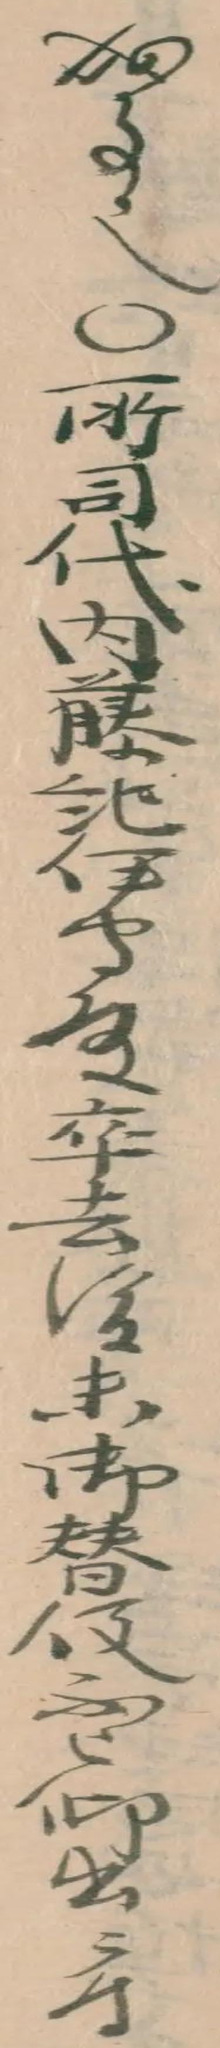成事也○所司代内藤紀伊守殿卒去後未御替役不被仰出ニ付
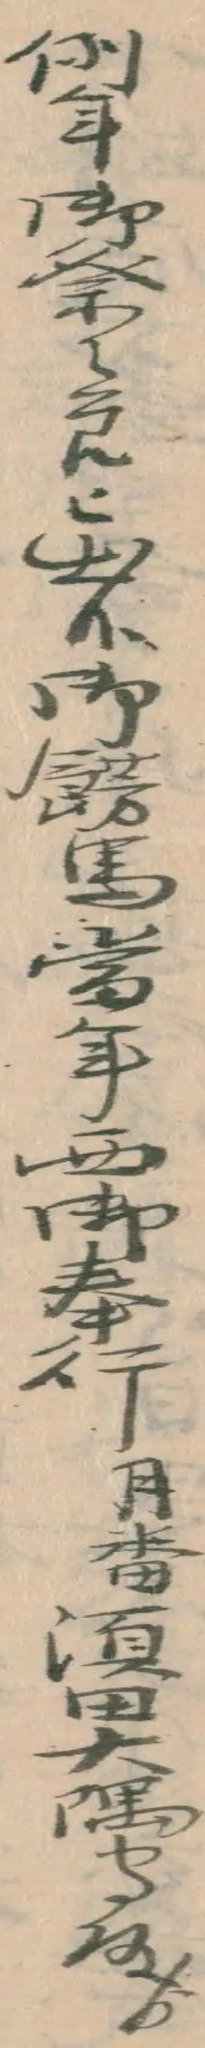例年御祭之節被出候御餝馬當年西御奉行月番須田大隅守殿ゟ
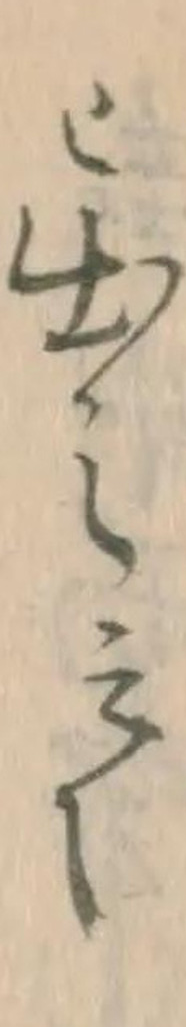被出之云々
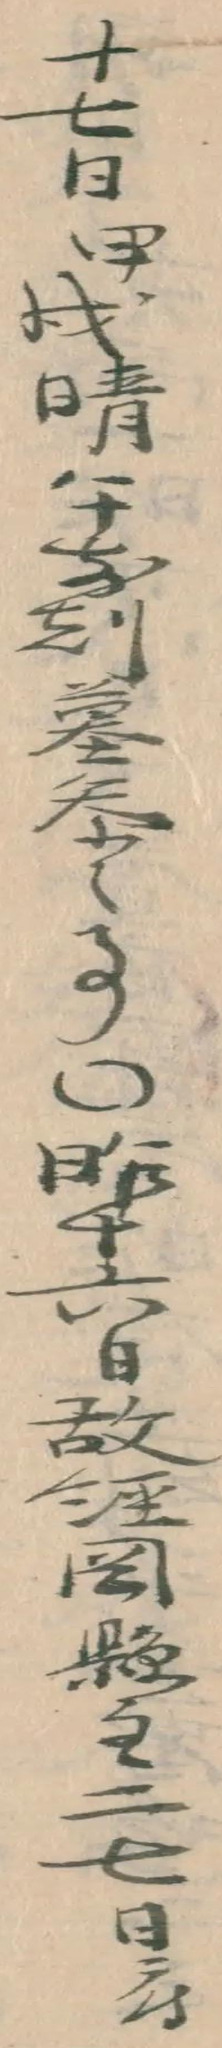十七日甲戌晴午前刻墓参之事〇昨十六日故経岡縣主ニ七日ニ付
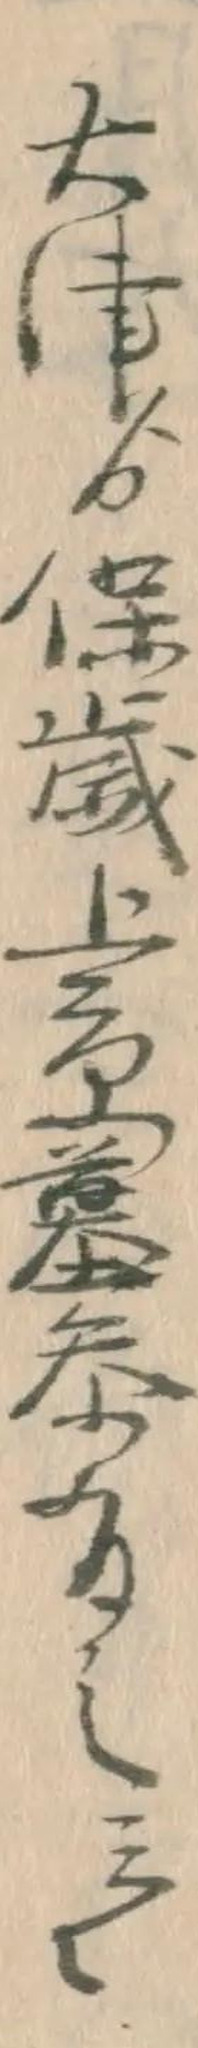大津ゟ保歳上京墓参有之云々
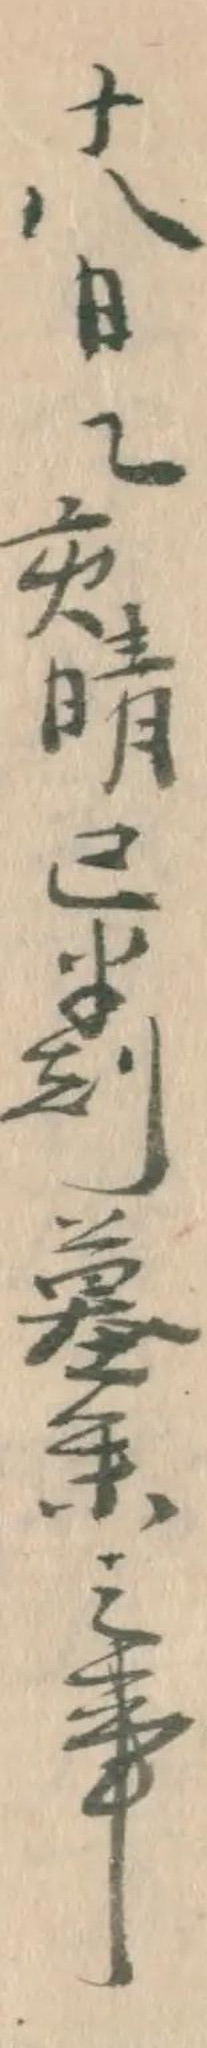十八日乙亥晴巳半刻墓参之事
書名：賀茂社記録. 第65冊
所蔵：国立国会図書館 National Diet Library, JAPAN
